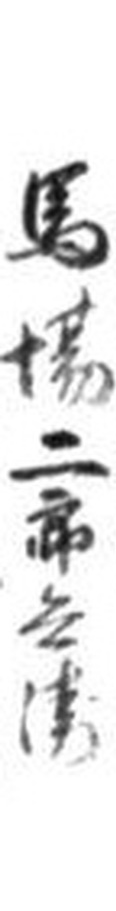馬場二郎兵衛
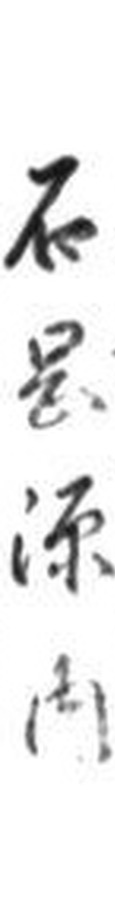石岡源内
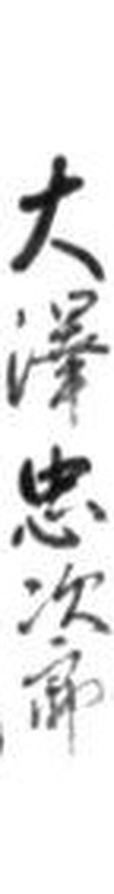大沢忠次郎
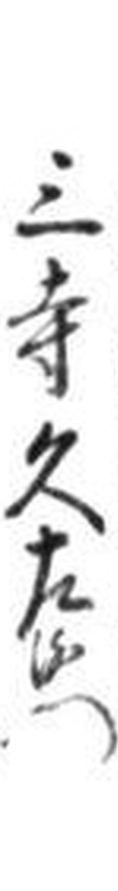三寺久左衛門
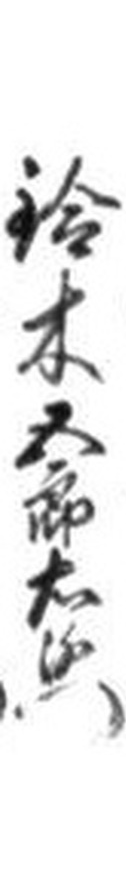鈴木五郎右衛門
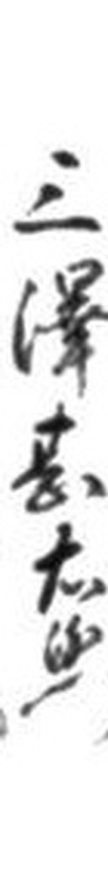三沢甚右衛門
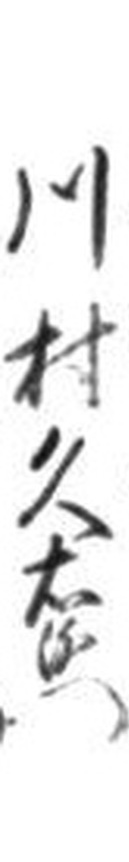川村久右衛門
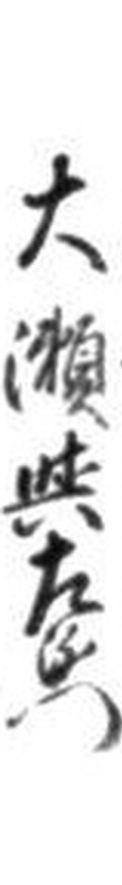大瀬与左衛門
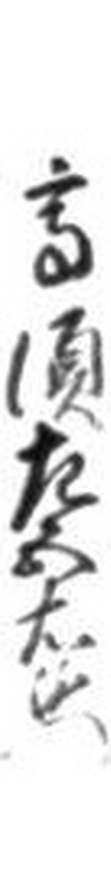高須左五右衛門
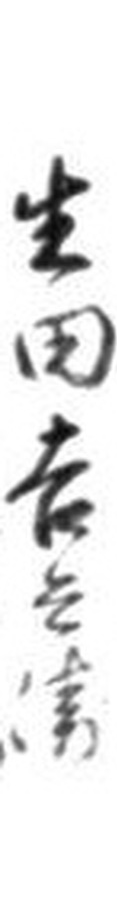生田吉兵衛
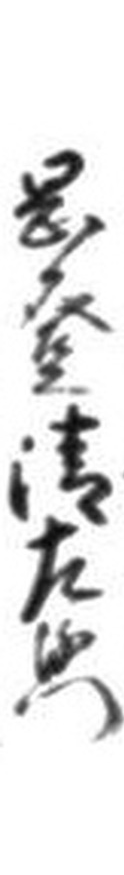岡登清左衛門
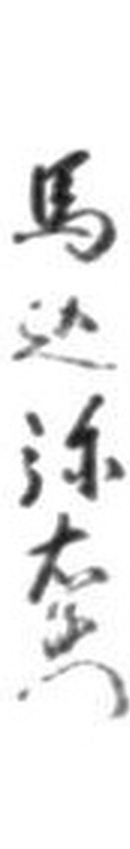馬込弥右衛門
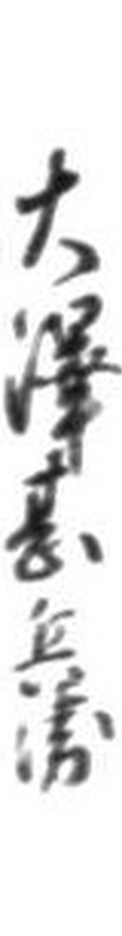大沢甚兵衛
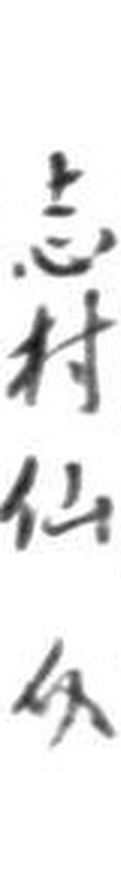志村仙介
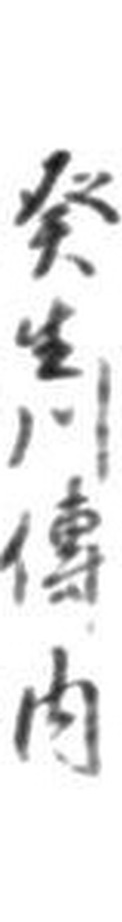癸生川伝内
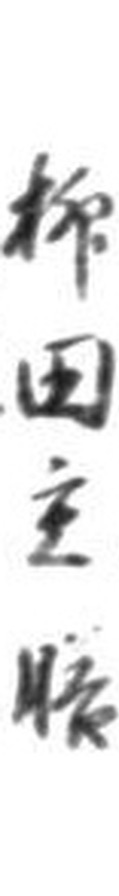柳田主膳
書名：家譜 二 忠直公 従文禄四年到慶安四年
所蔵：福井県文書館 Fukui Prefectural Archives
